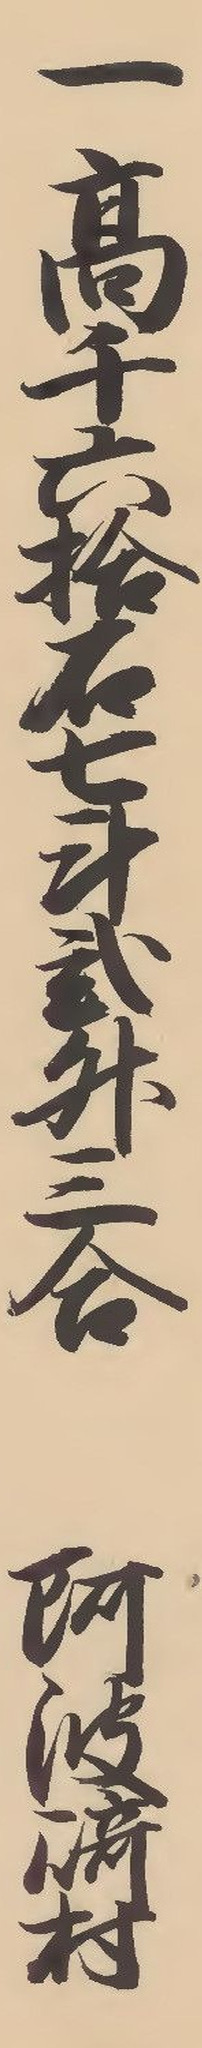一高千六拾石七斗弐升三合阿波崎村
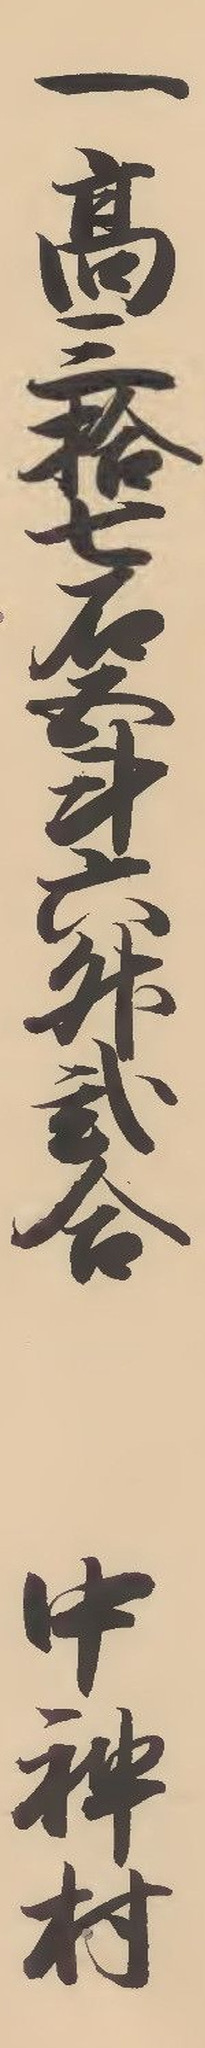一高三拾七石五斗六升弐合中神村
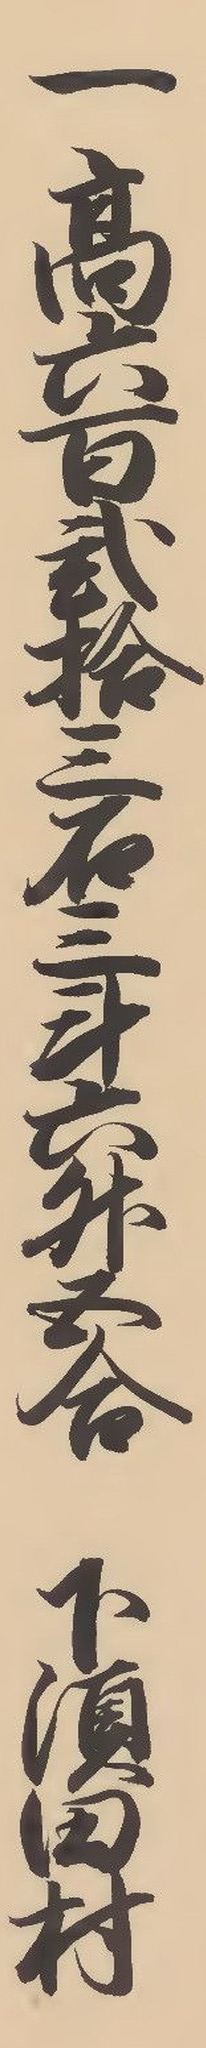一高六百弐拾三石三斗六升五合下須田村
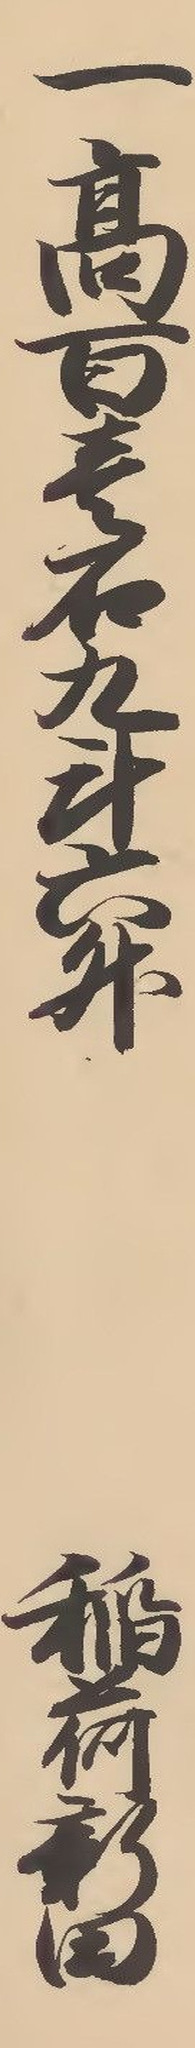一高百壱石九斗六升稲荷新田
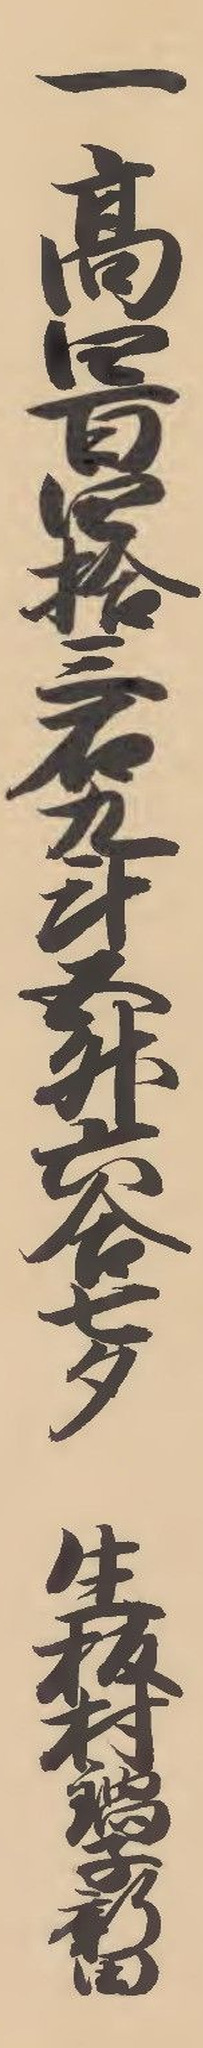一高四百四拾三石九斗五升六合七勺生板村鍋子新田
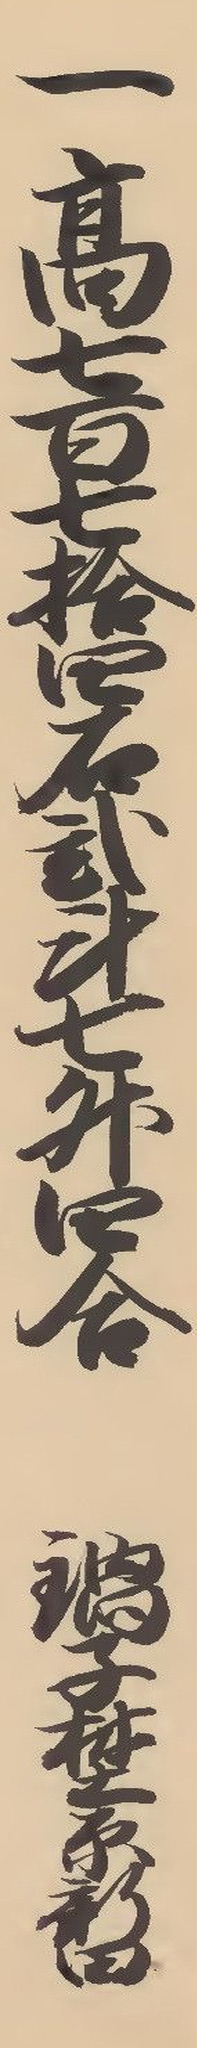一高七百七拾四石弐斗七升四合鍋子埜原新田
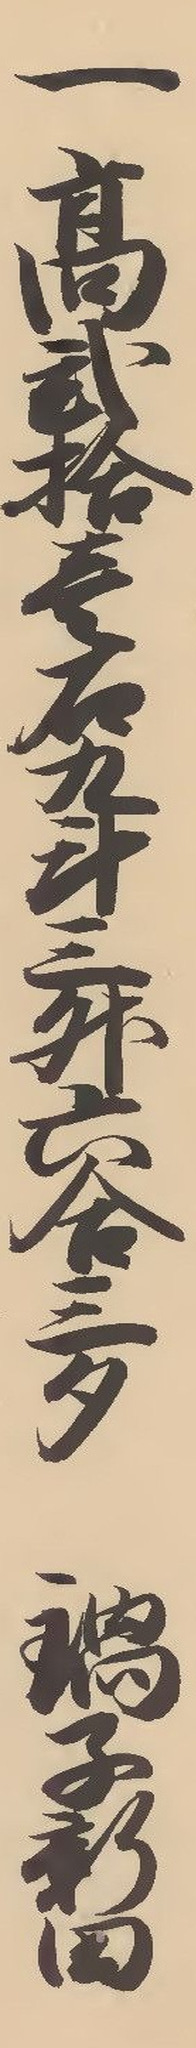一高弐拾壱石九斗三升六合三勺鍋子新田
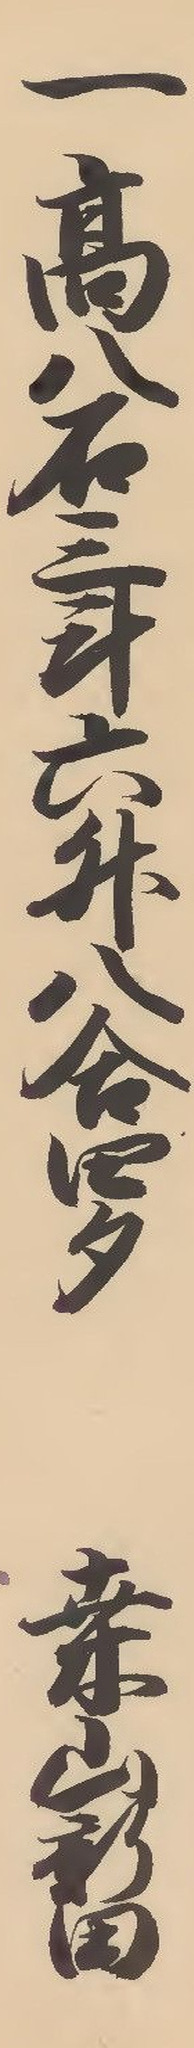一高八石三斗六升八合四勺桑山新田

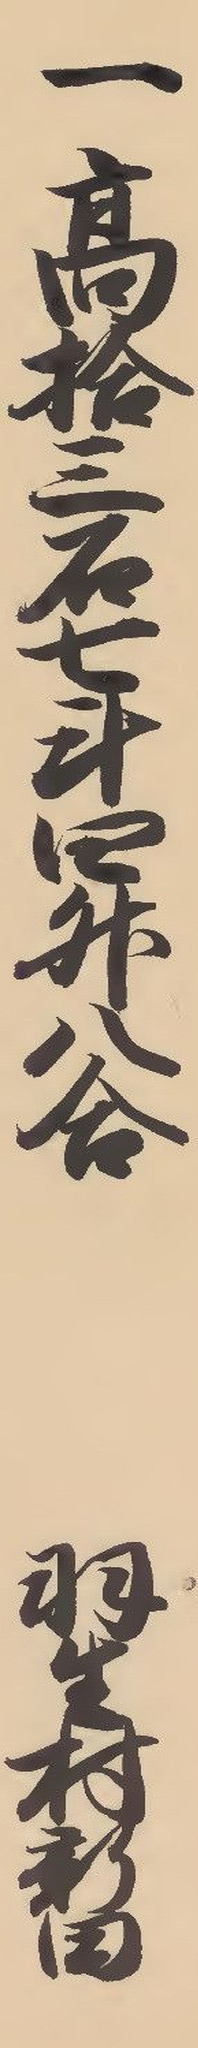一高拾三石七斗四升八合羽生村新田
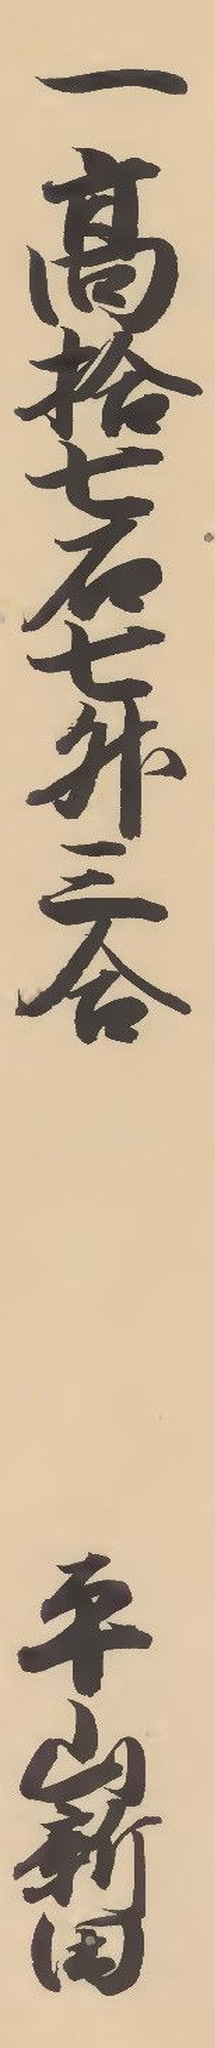一高拾七石七升三合平山新田
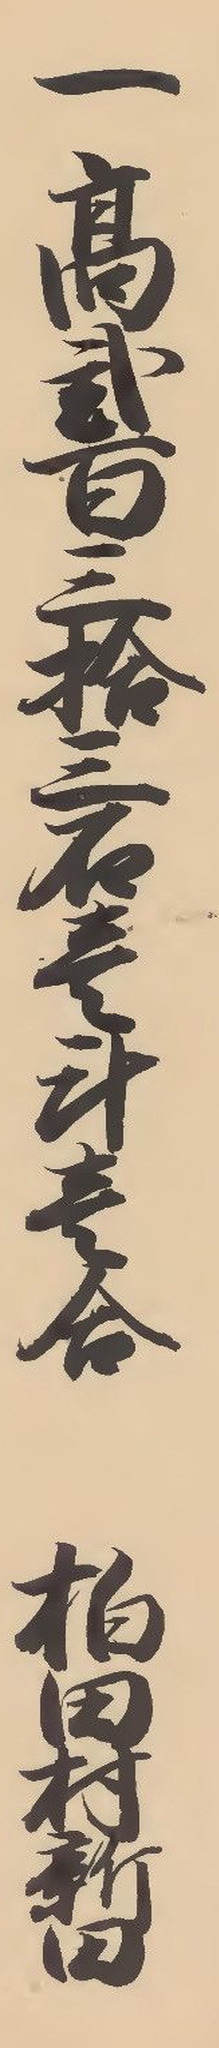一高弐百三拾三石壱斗壱合柏田村新田
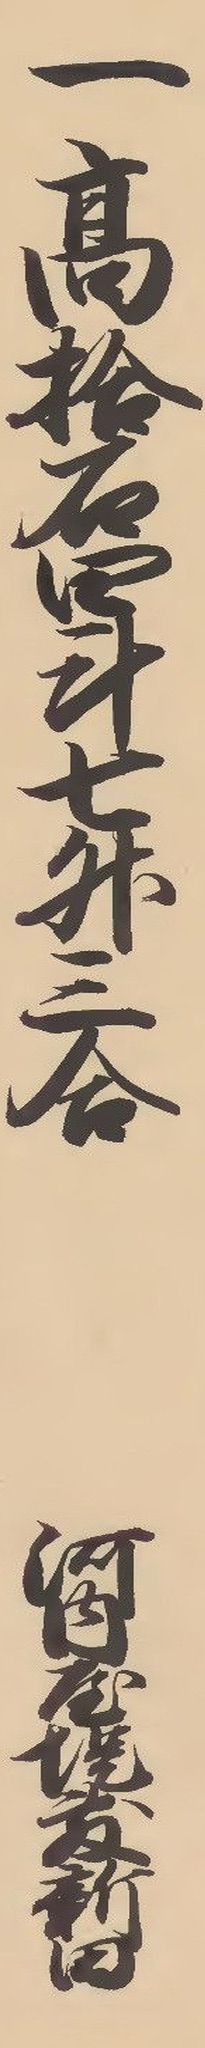一高拾石四斗七升三合河内屋堤敷新田
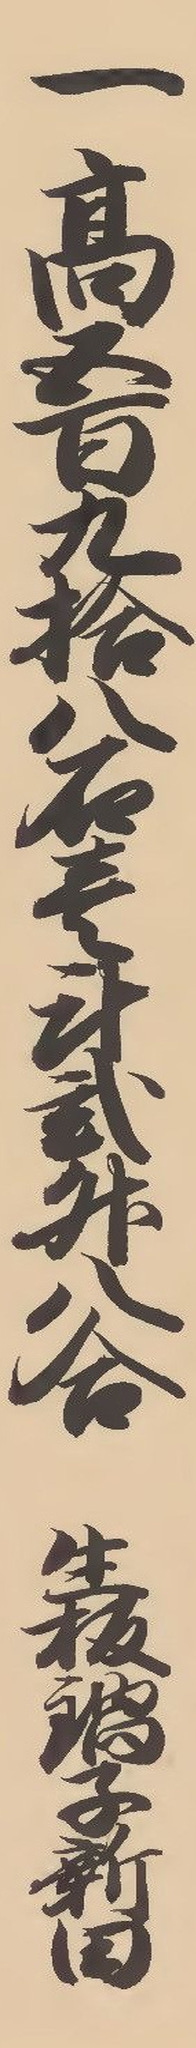一高五百九拾八石壱斗弐升八合生板鍋子新田
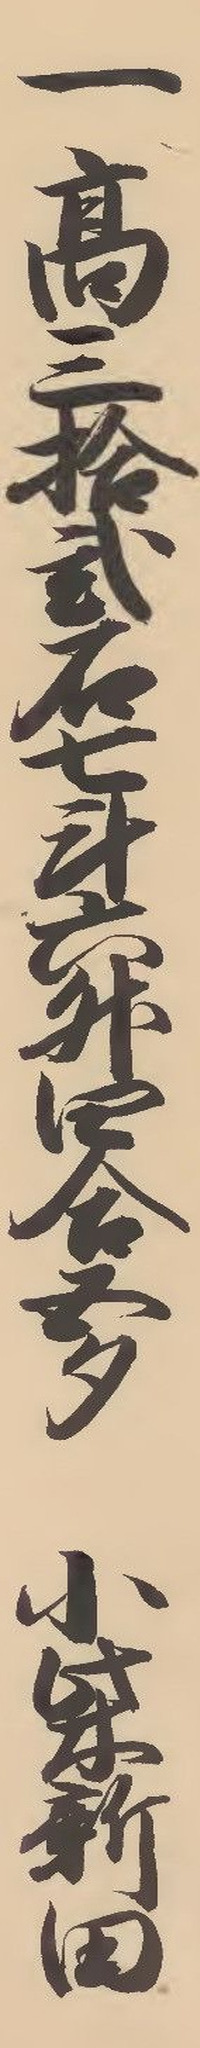一高三拾弐石七斗六升四合五勺小柴新田
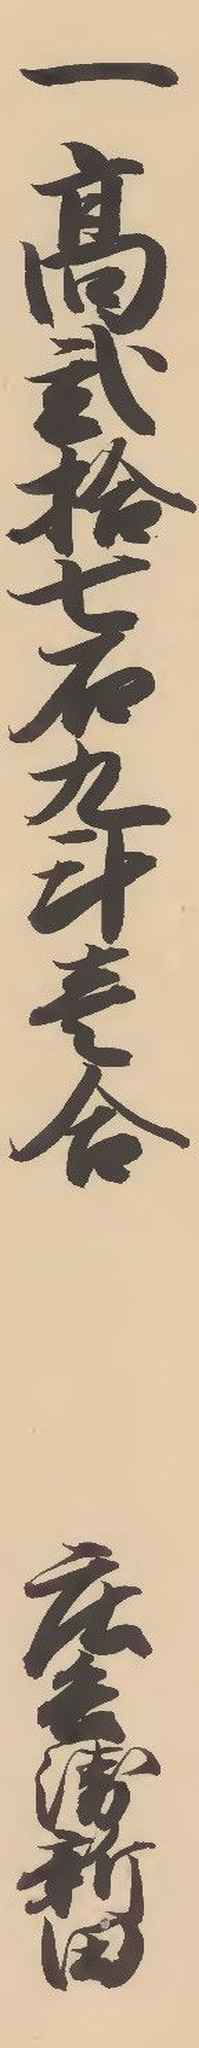一高弐拾七石九斗壱合庄兵衛新田
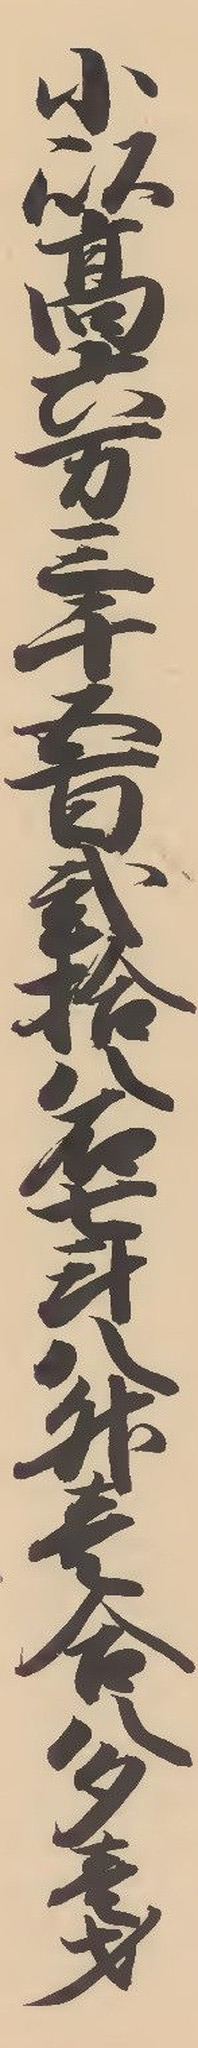小以高六万三千五百弐拾八石七斗八升壱合八勺壱才
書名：常陸国郷帳
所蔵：国立公文書館 National Archives of Japan
